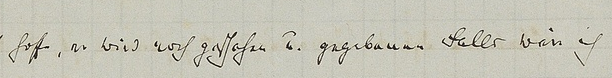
hoffe, er wird noch geschehen u. gegebenen Falls wäre ich
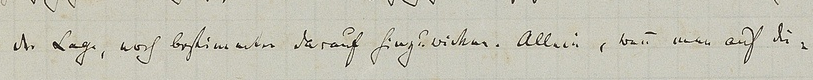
der Lage, noch bestimmter darauf hinzuwirken. Allein, wenn man auf die-
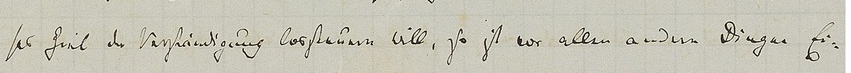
ses Ziel der Verständigung lossteuern will, so ist vor allen andern Dingen Ei-
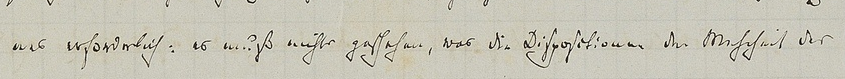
nes erforderlich: es muß nichts geschehen, was die Dispositionen der Mehrheit des
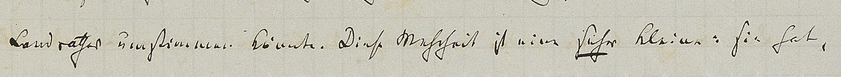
Landrathes umstimmen könnte. Diese Mehrheit ist eine sehr kleine: sie hat,
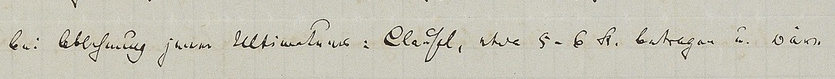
bei Ablehnung jener Ultimatums-Clausel, etwa 5–6 St. betragen u. wäre
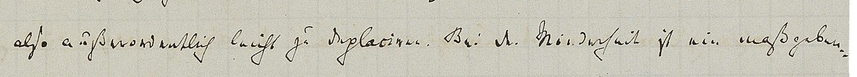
also außergewöhnlich leicht zu deplaciren. Bei der Minderheit ist ein maßgeben-
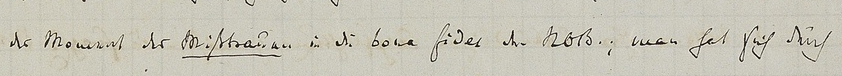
des Moment das Mißtrauen in die bona fides der NOB.; man hat sich durch
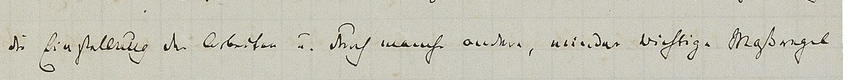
die Einstellung der Arbeiten u. durch manche andere, minder wichtige Maßregel
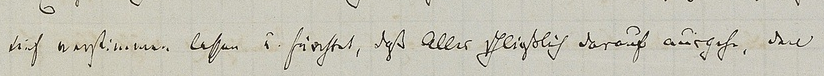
tief verstimmen lassen u. fürchtet, daß Alles schließlich darauf ausgehe, den
